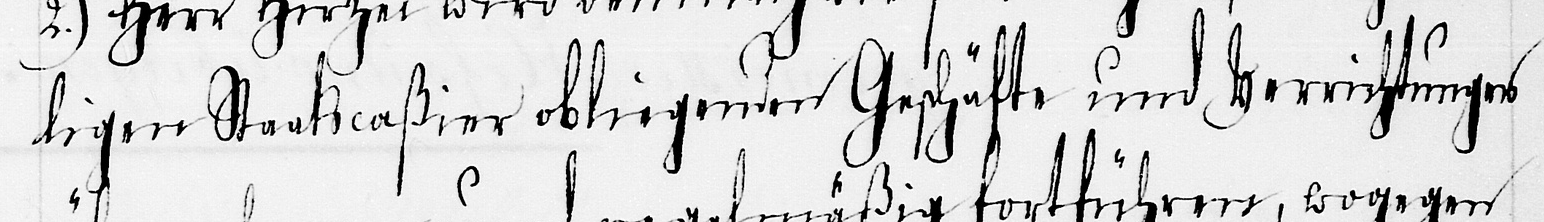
ligen Staatscaßier obliegenden Geschäfte und Verrichtungen
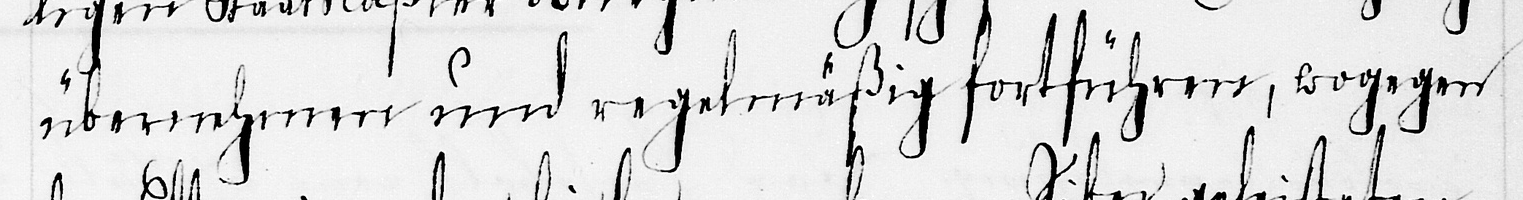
übernehmen und regelmäßig fortführen, wogegen
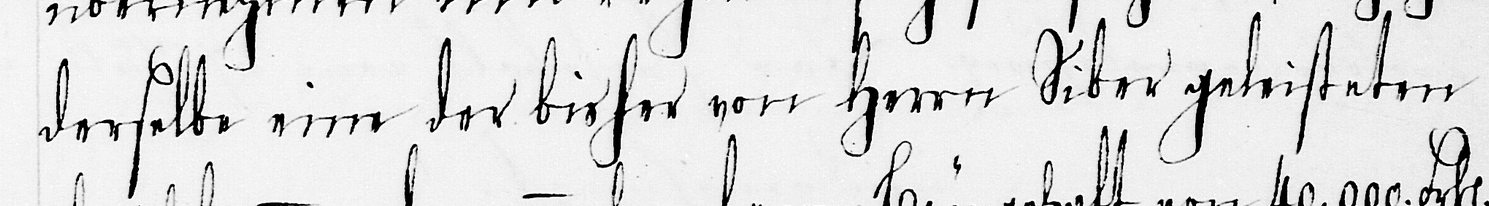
derselbe eine der bisher von Herrn Siber geleisteten
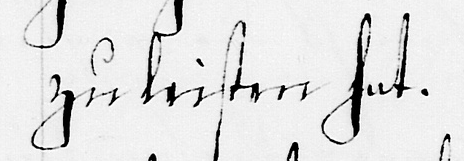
zu leisten hat.
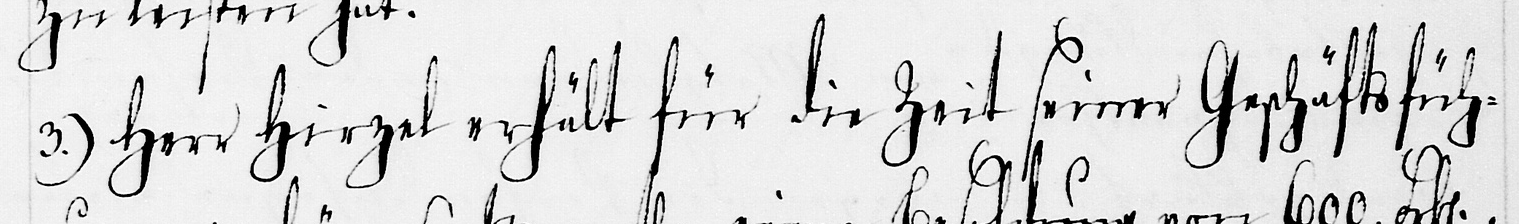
3.) Herr Hirzel erhält für die Zeit seiner Geschäftsfüh¬
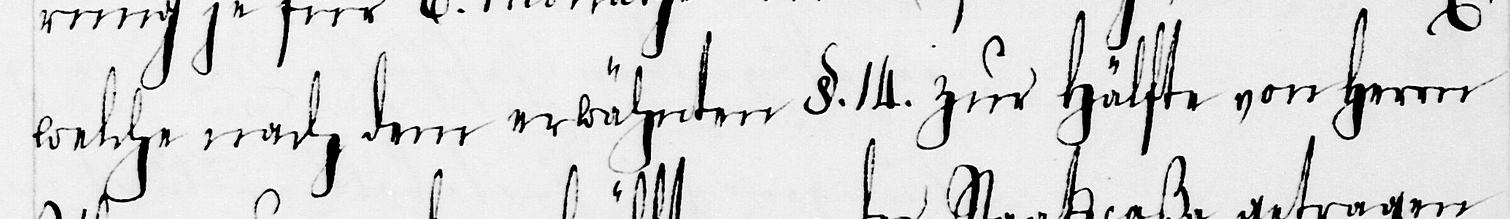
welche nach dem erwähnten §. 14. zur Hälfte von Herrn
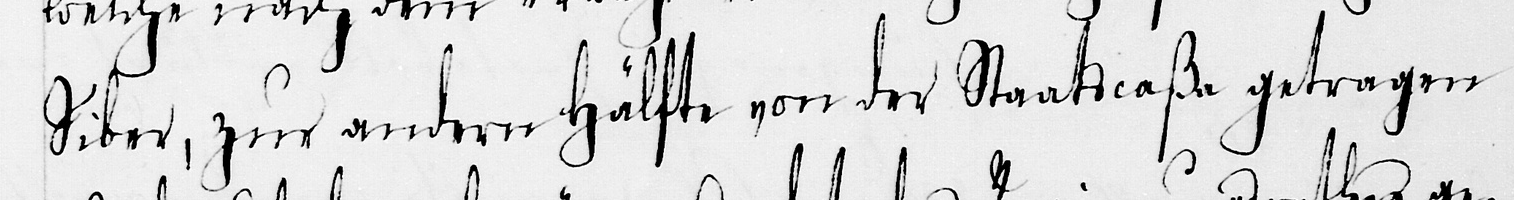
Siber, zur andern Hälfte von der Staatscaßa getragen
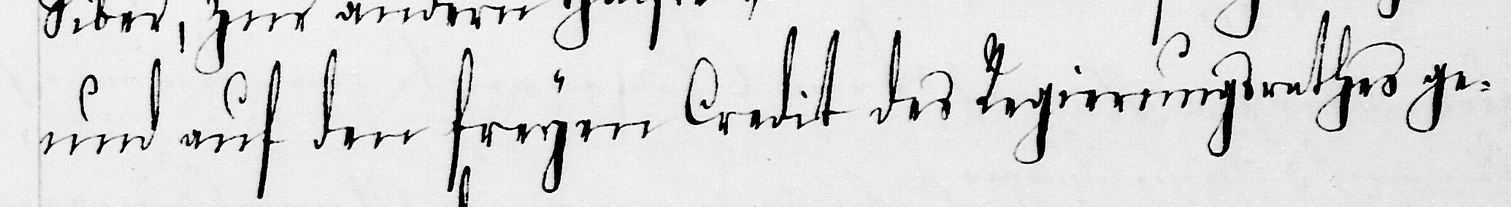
und auf den freyen Credit des Regierungsrathes ge¬
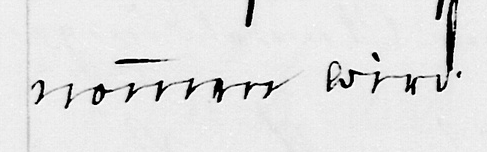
nommen wird.
